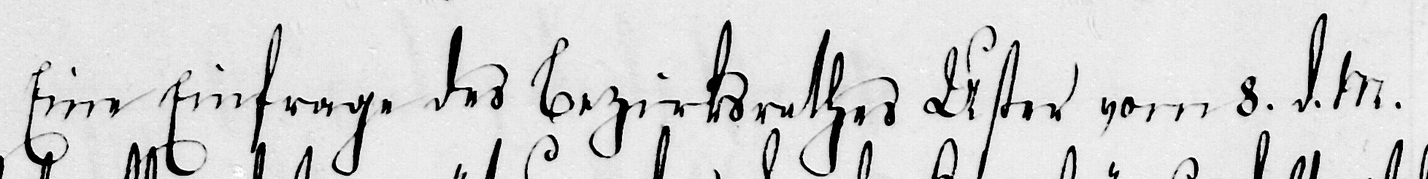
Eine Einfrage des Bezirksrathes Uster vom 8. d. M.
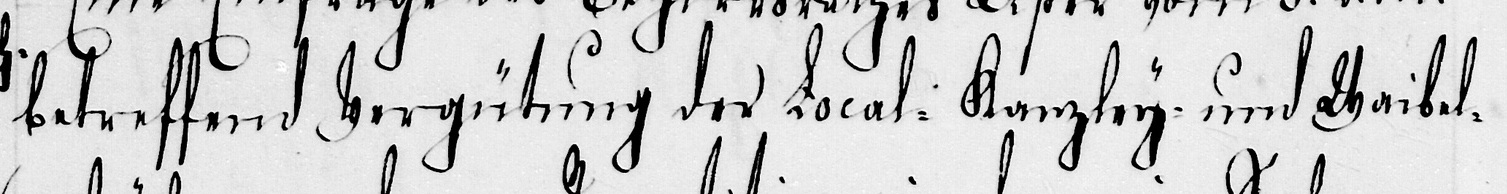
betreffend Vergütung der Local-Kanzley- und Waibel¬
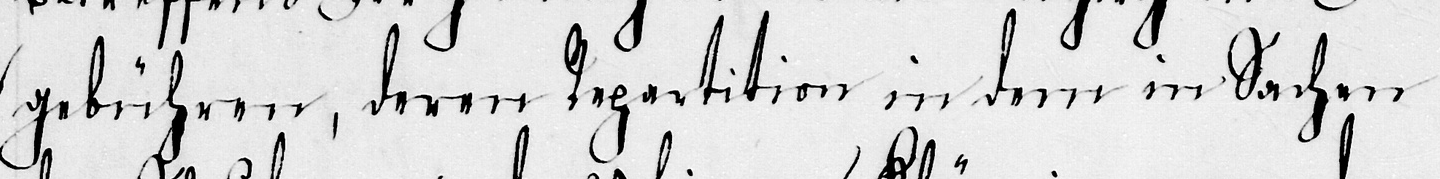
gebühren, deren Repartition in dem in Sachen
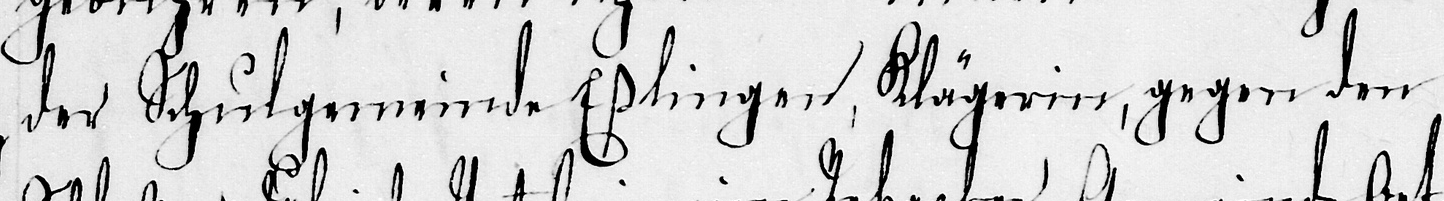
der Schulgemeinde Eßlingen, Klägerin, gegen den
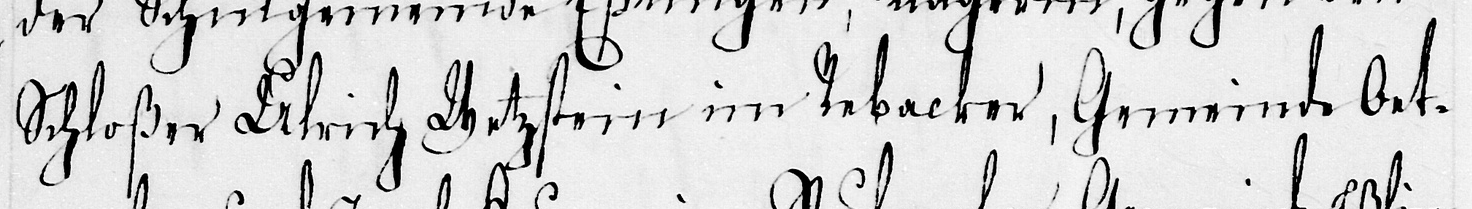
Schloßer Ulrich Wetzstein in Rebacker, Gemeinde Oet¬
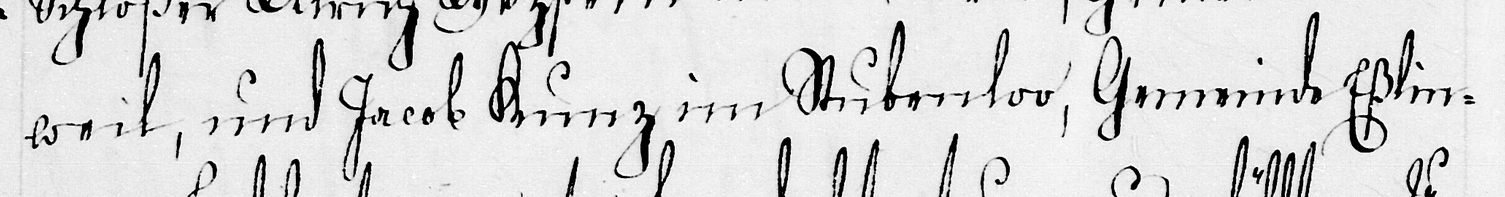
weil, und Jacob Kunz im Stubenloo, Gemeinde Eßlin¬
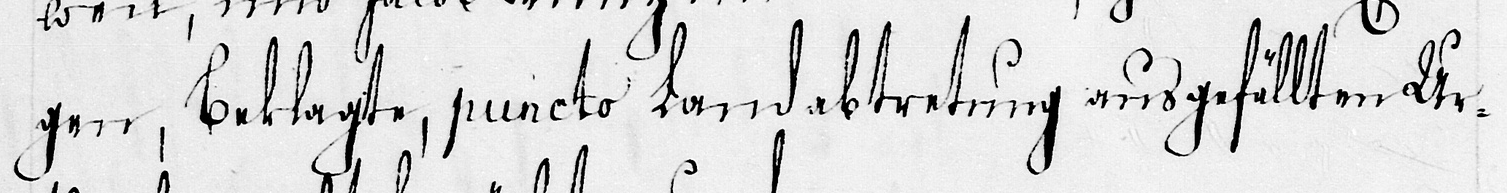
gen, Beklagte, puncto Landabtretung ausgefällten Ur¬
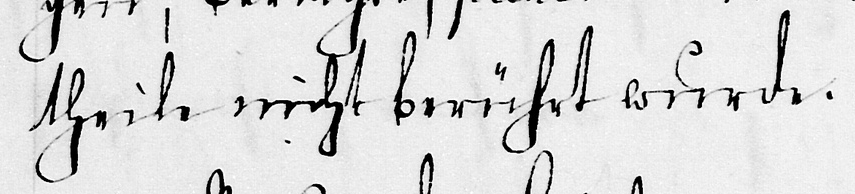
theile nicht berührt wurde.
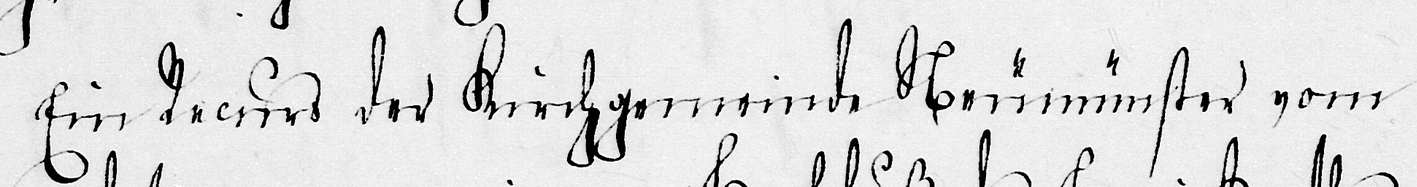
Ein Recurs der Kirchgemeinde Neumünster vom
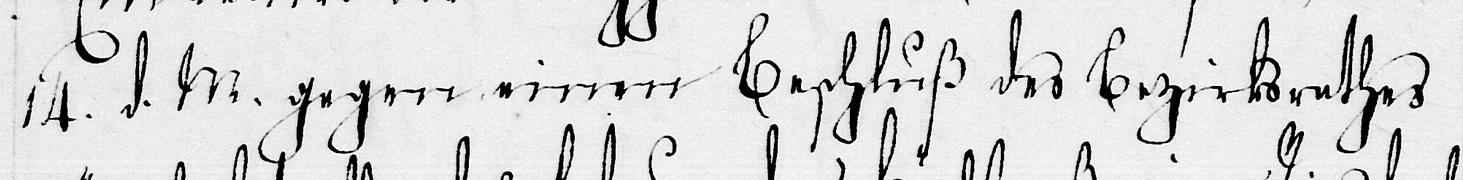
14. d. M. gegen einen Beschluß des Bezirksrathes
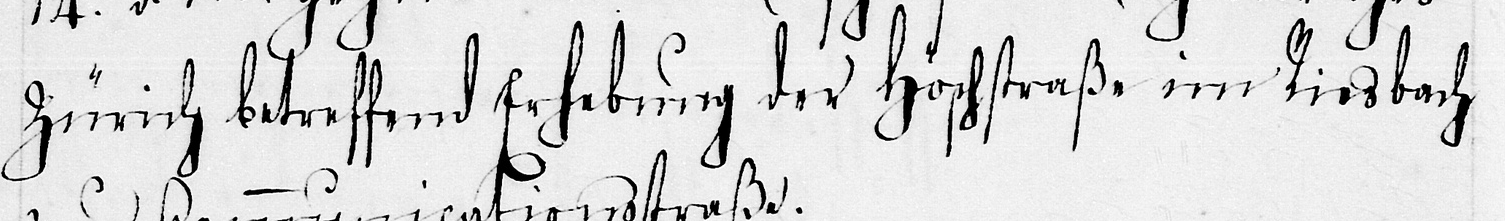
Zürich betreffend Erhebung der Höschstraße im Riesbach
